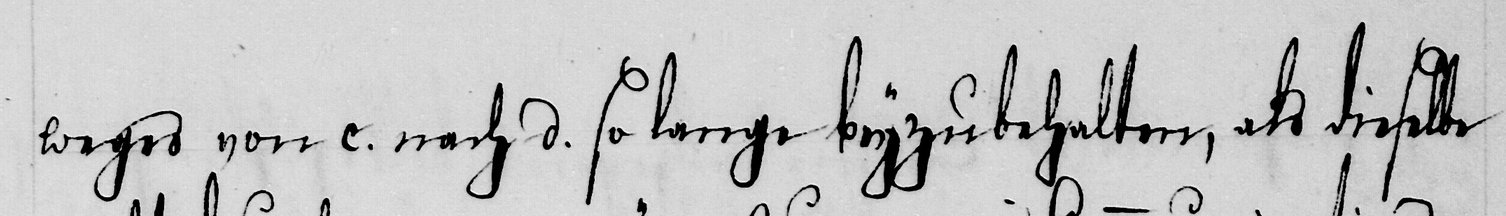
weges von c. nach d. so lange beyzubehalten, als dieselbe
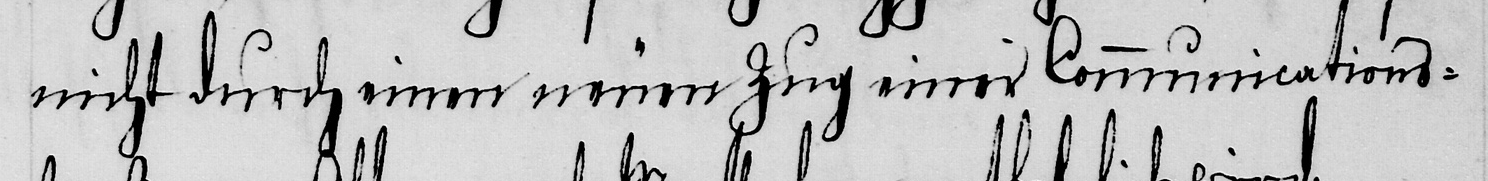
nicht durch einen neuen Zug einer Communications¬
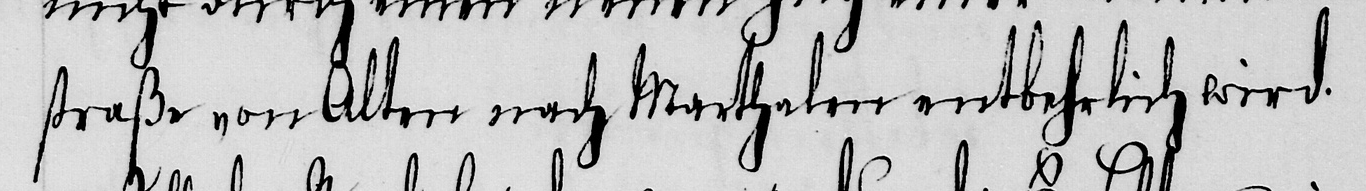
straße von Alten nach Marthalen entbehrlich wird.
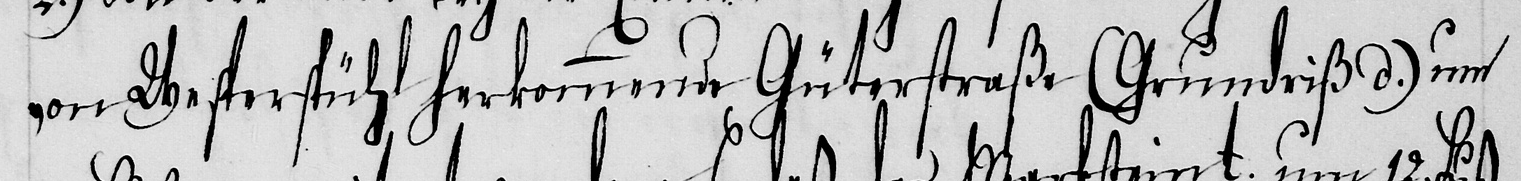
von Wesperspühl herkommende Güterstraße (Grundriß d.) um
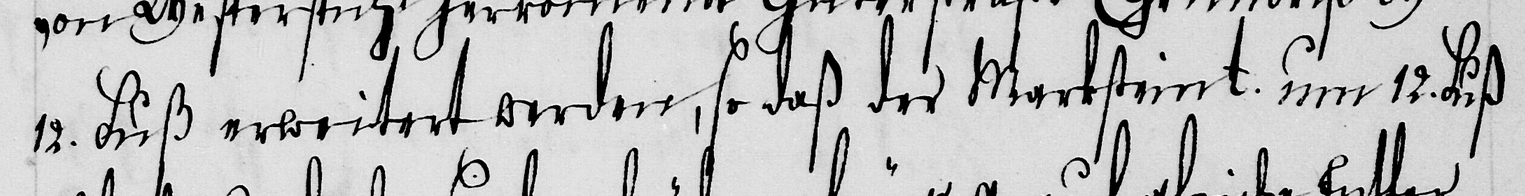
12. Fuß erweitert werden, so daß der Markstein t. um 12. Fuß
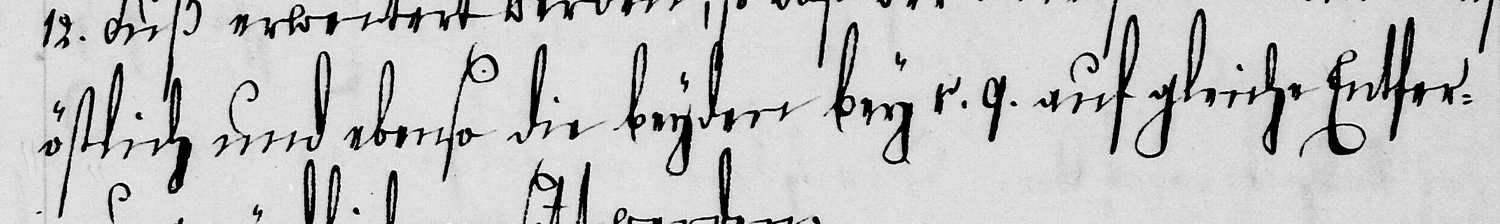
die beyden bey r. q. auf gleiche Entfe¬
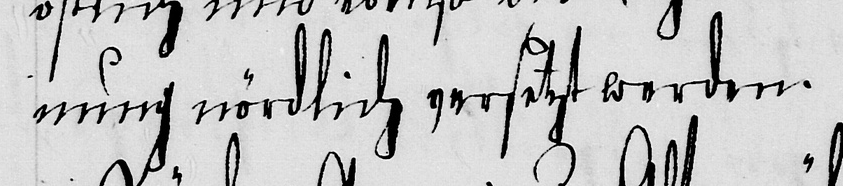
rnung nördlich versetzt werden.
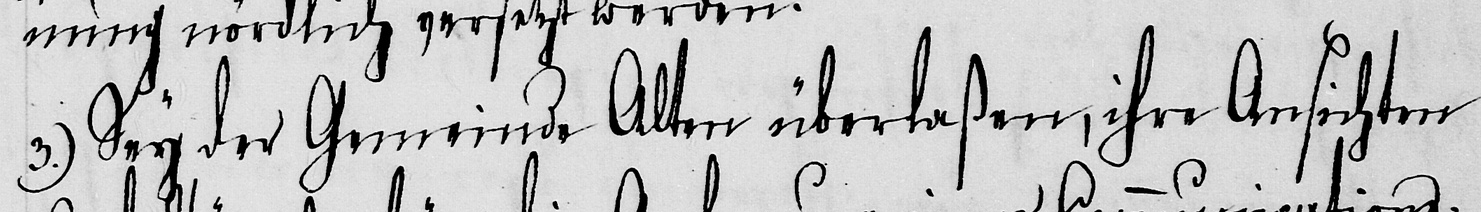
3.) Sey der Gemeinde Alten überlaßen, ihre Ansichten
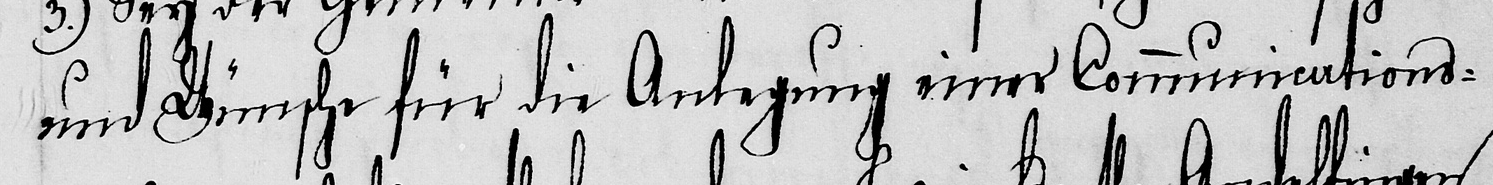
und Wünsche für die Anlegung einer Communications¬
